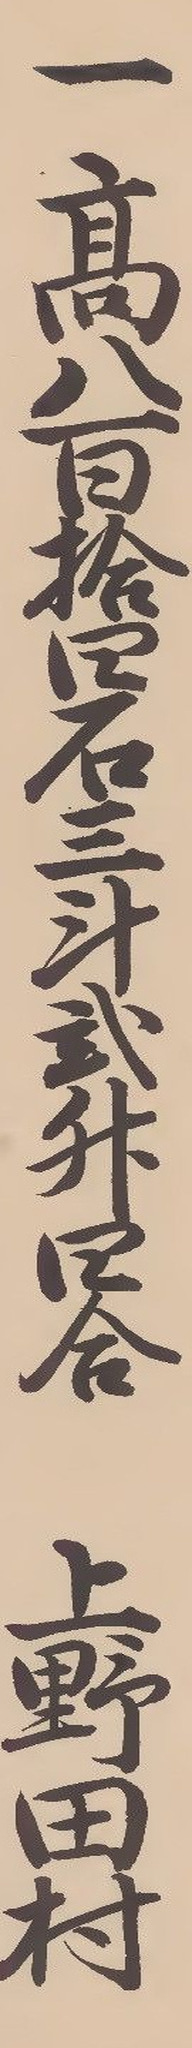一高八百拾四石三斗弐升四合上野田村
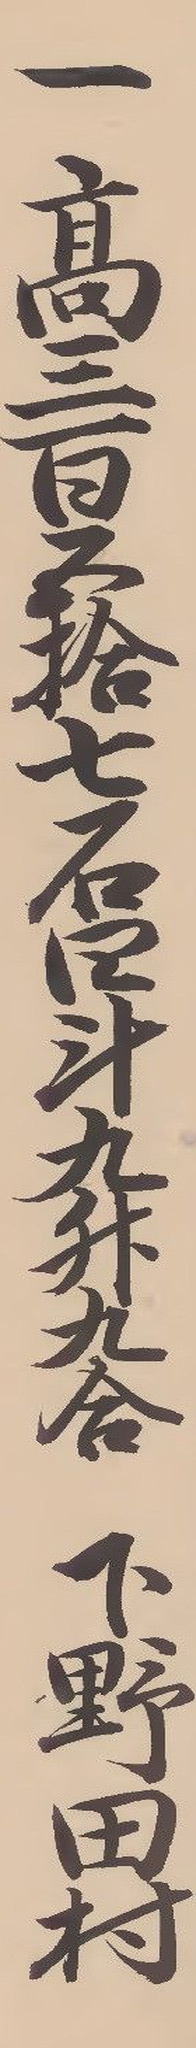一高三百五拾七石四斗九升九合下野田村
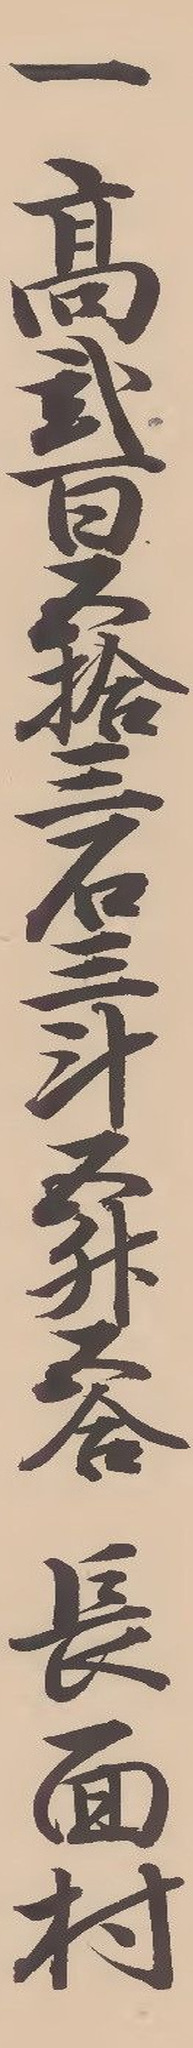一高弐百五拾三石三斗五升五合長面村
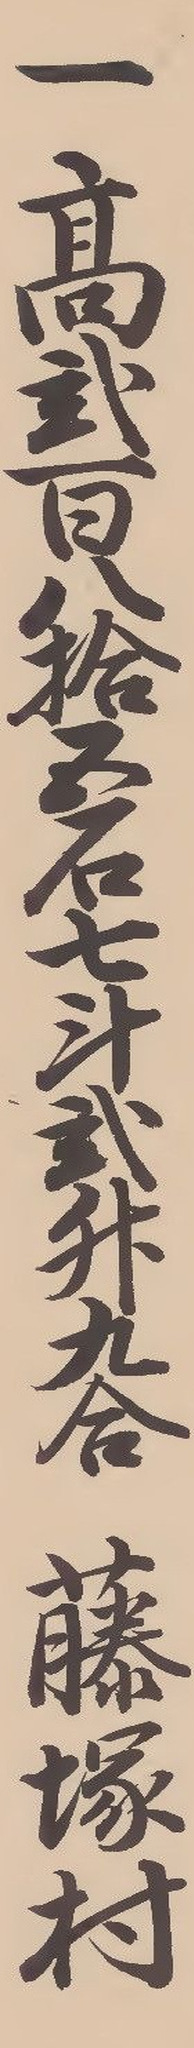一高弐百八拾五石七斗弐升九合藤塚村
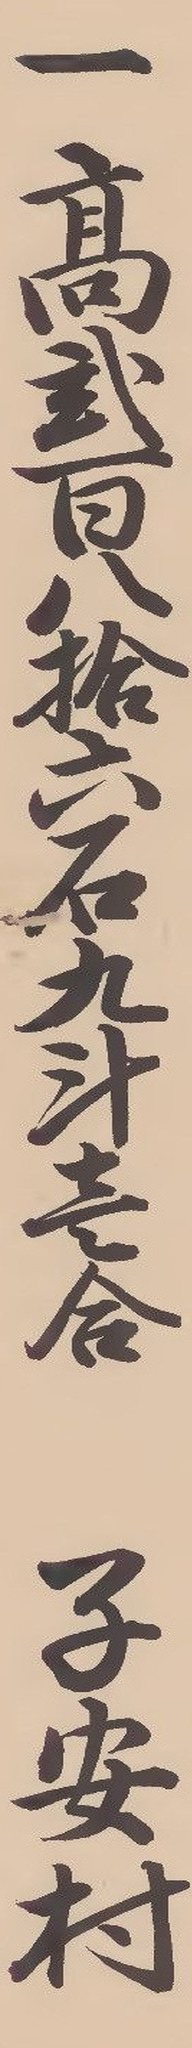一高弐百八拾六石九斗壱合子安村

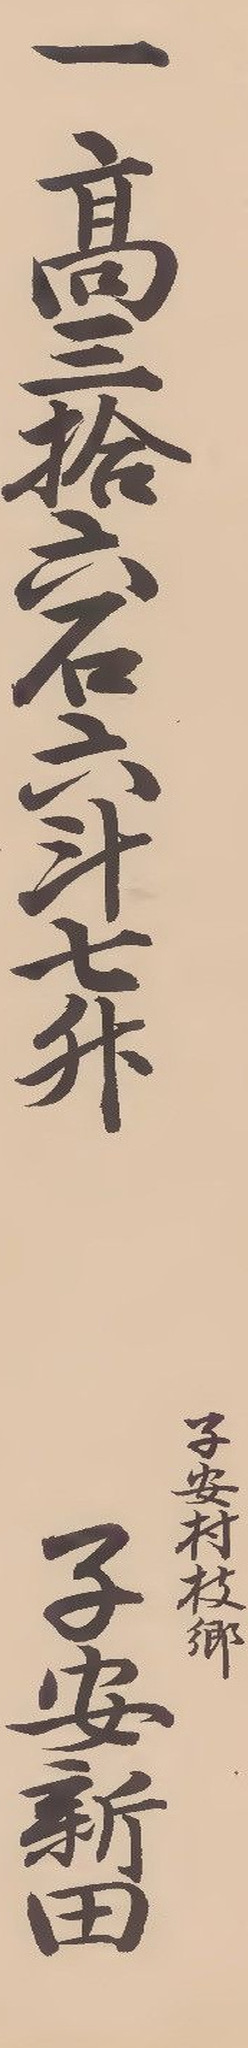一高三拾六石六斗七升子安新田
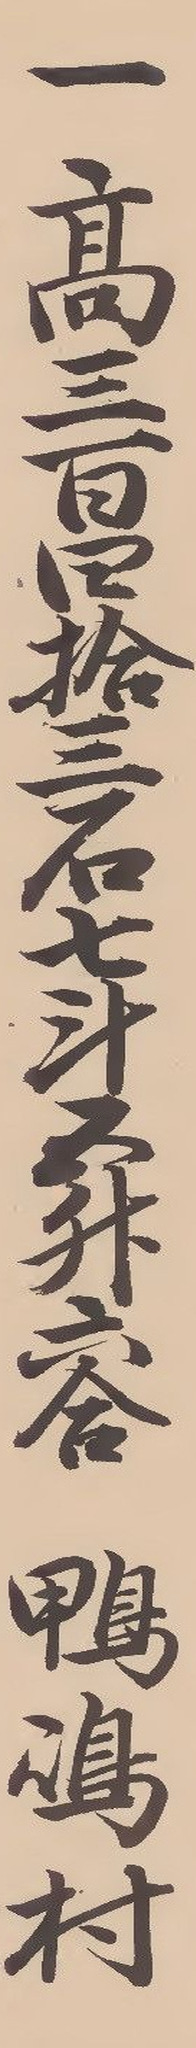一高三百四拾三石七斗五升六合鴨島村
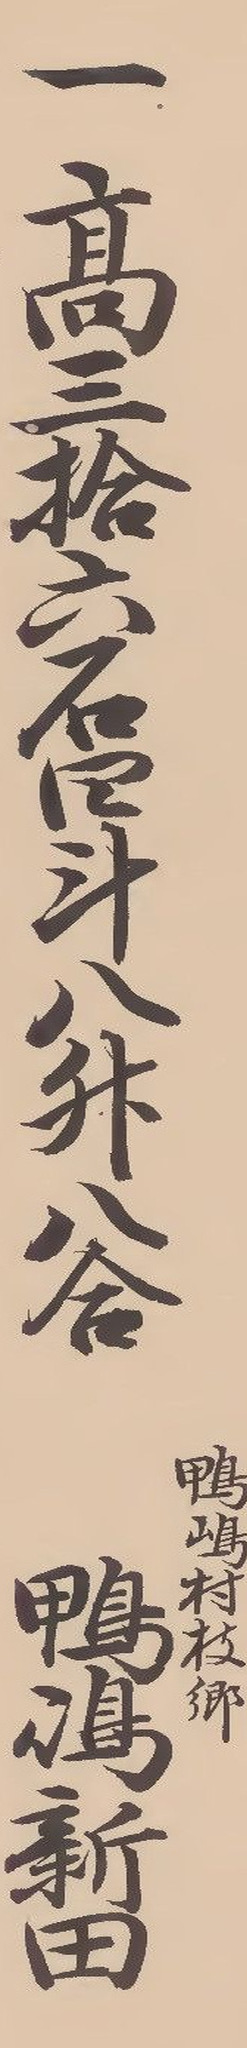一高三拾六石四斗八升八合鴨島新田
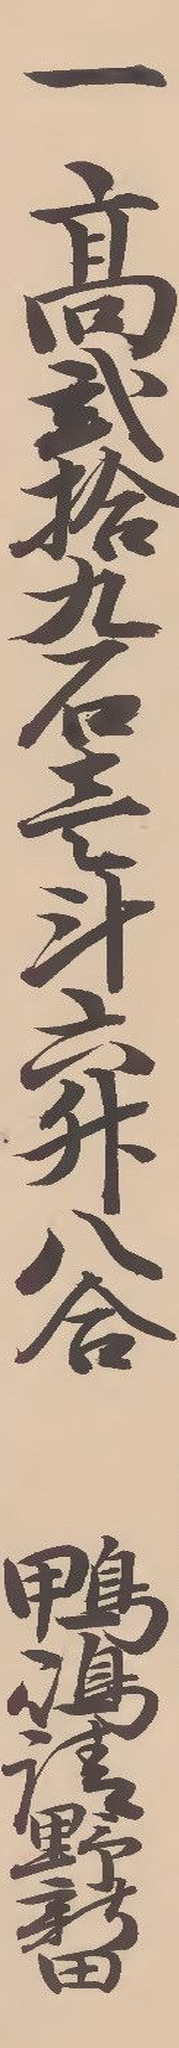一高弐拾九石壱斗六升八合鴨島請野新田
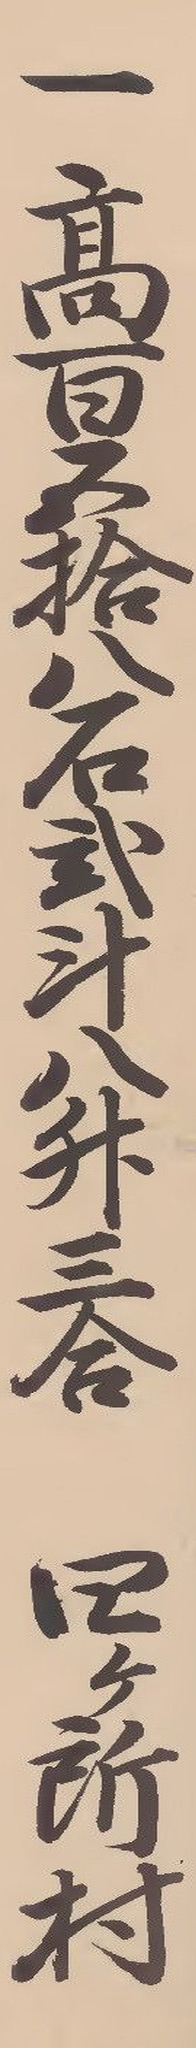一高百五拾八石弐斗八升三合四ヶ所村
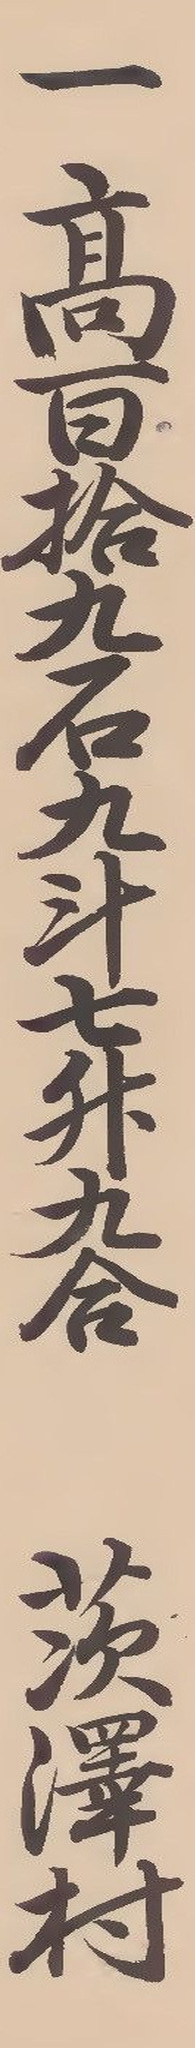一高百拾九石九斗七升九合茨沢村
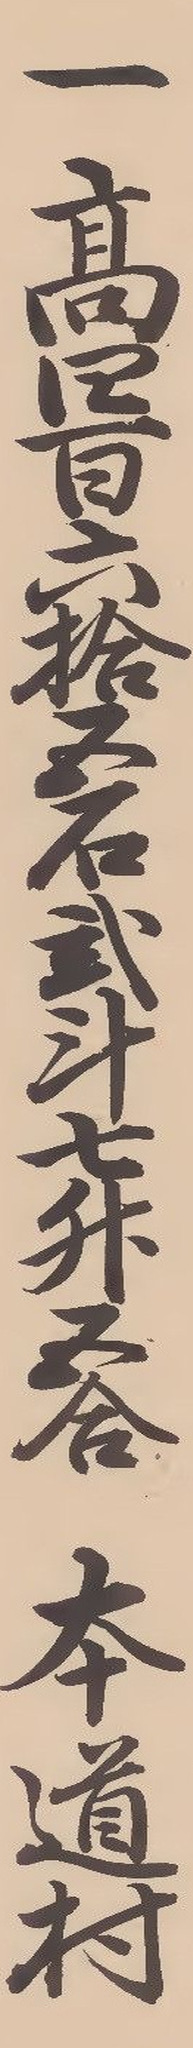一高四百六拾五石弐斗七升五合本道村
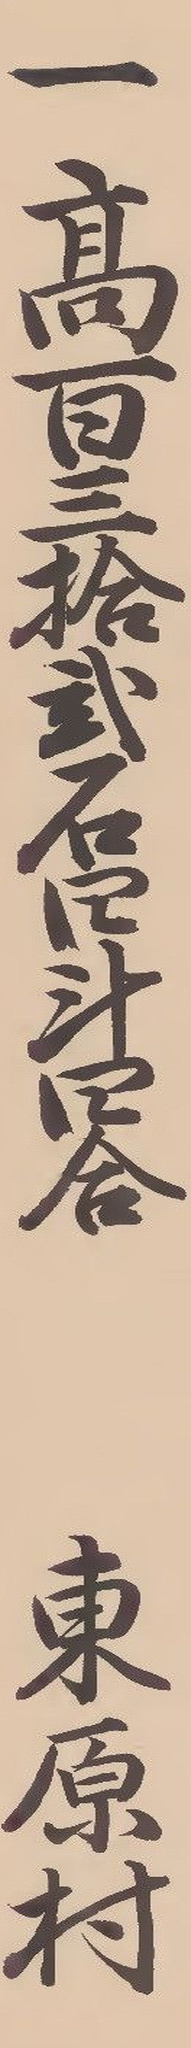一高百三拾弐石四斗四合東原村

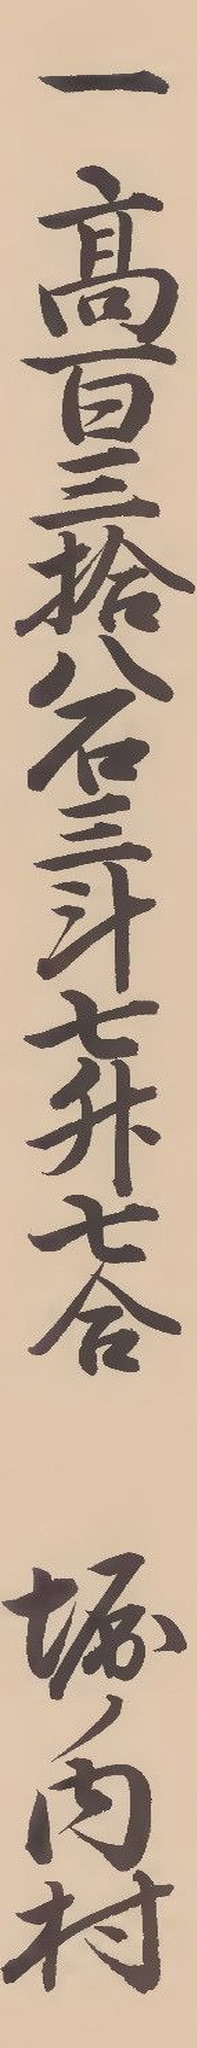一高百三拾八石三斗七升七合堀ノ内村
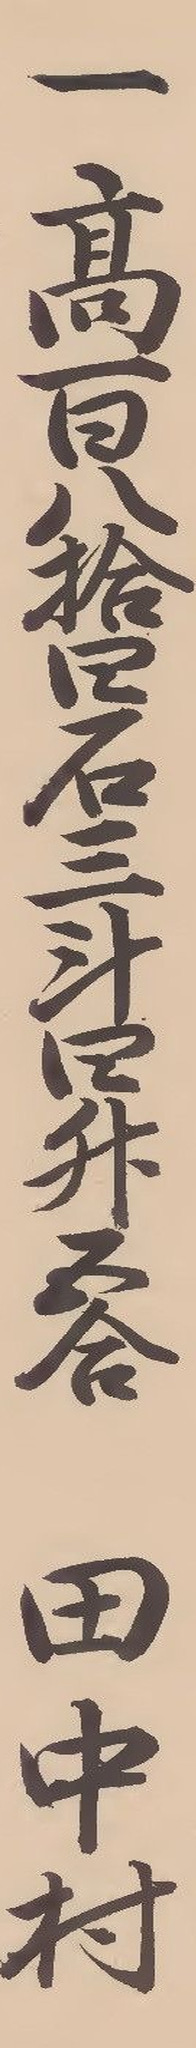一高百八拾四石三斗四升五合田中村
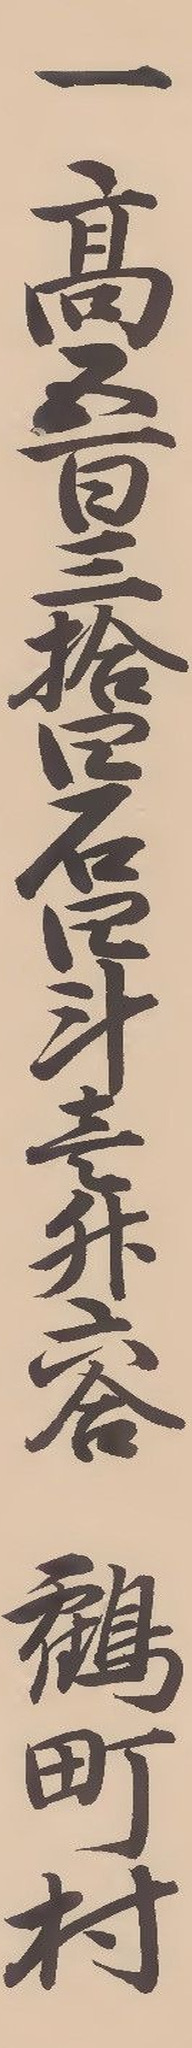一高五百三拾四石四斗壱升六合鶴町村
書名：越後国郷帳　上
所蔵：国立公文書館 National Archives of Japan
